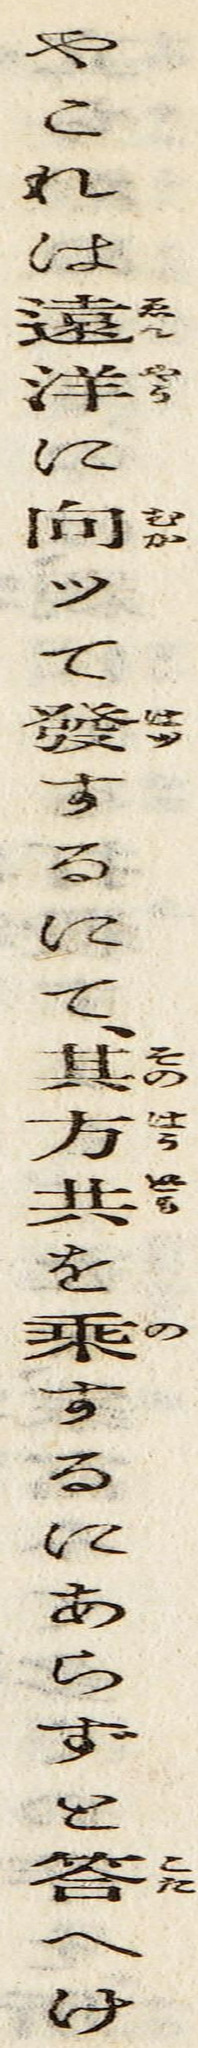やこれは遠洋に向ツて発するにて、其方共を乗するにあらずと答へけ
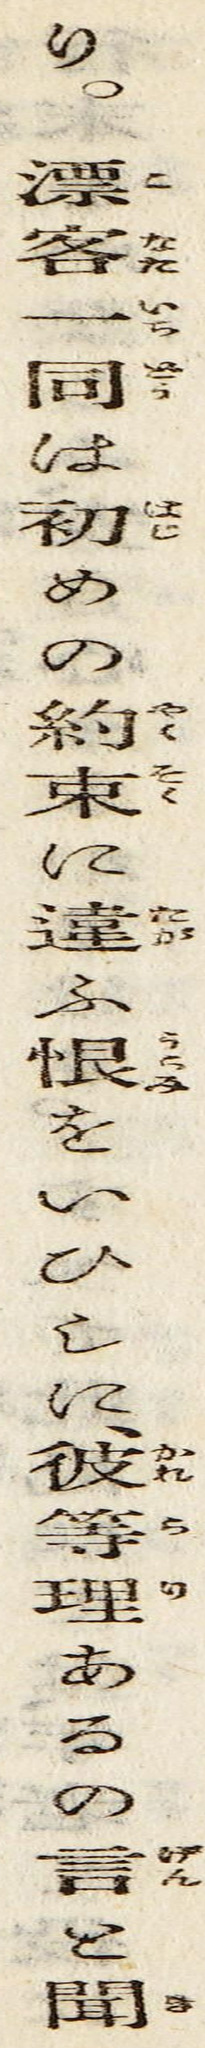り。漂客一同は初めの約束に違ふ恨をいひしに、彼等理あるの言と聞
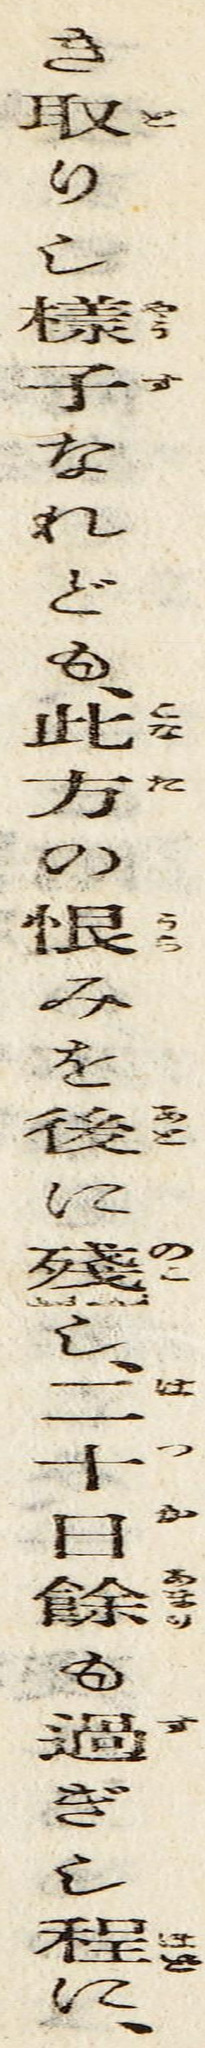き取りし様子なれども、此方の恨みを後に残し、二十日余も過ぎし程に、
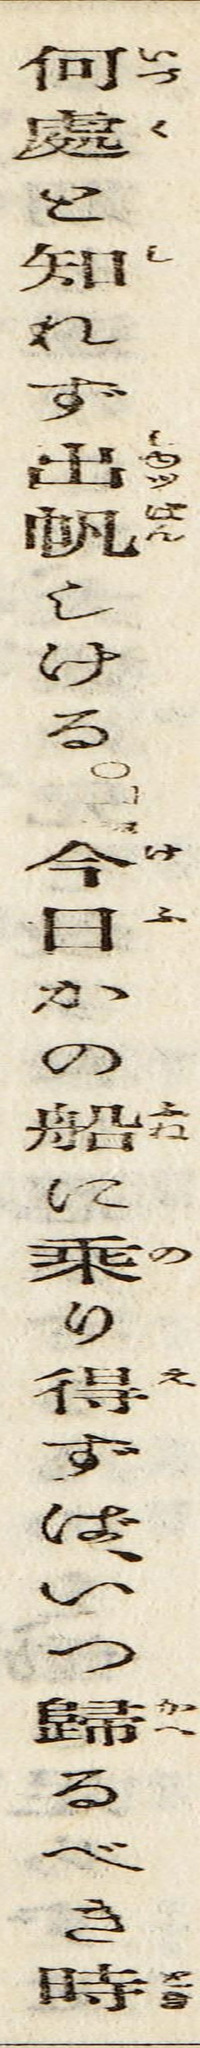何処と知れず出帆しける。今日かの船に乗り得ずば、いつ帰るべき時
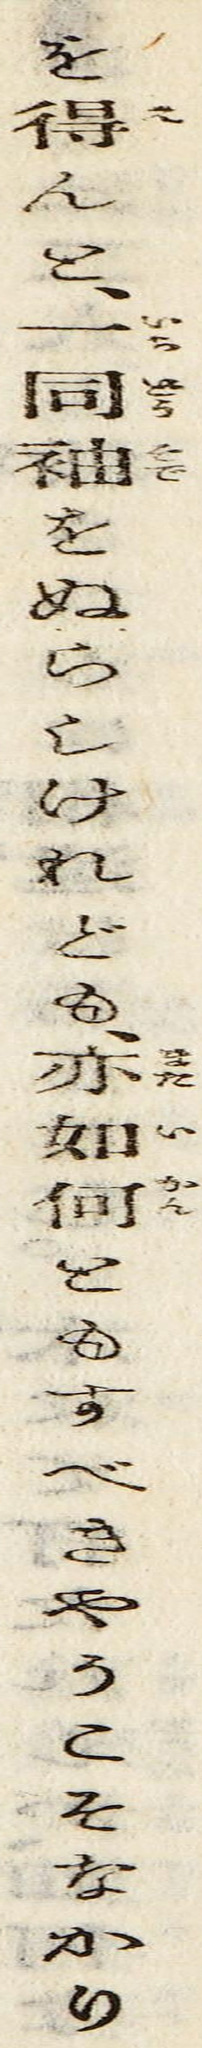を得んと、一同袖をぬらしけれども、亦如何ともすべきやうこそなかり
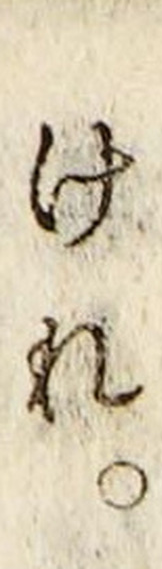けれ。
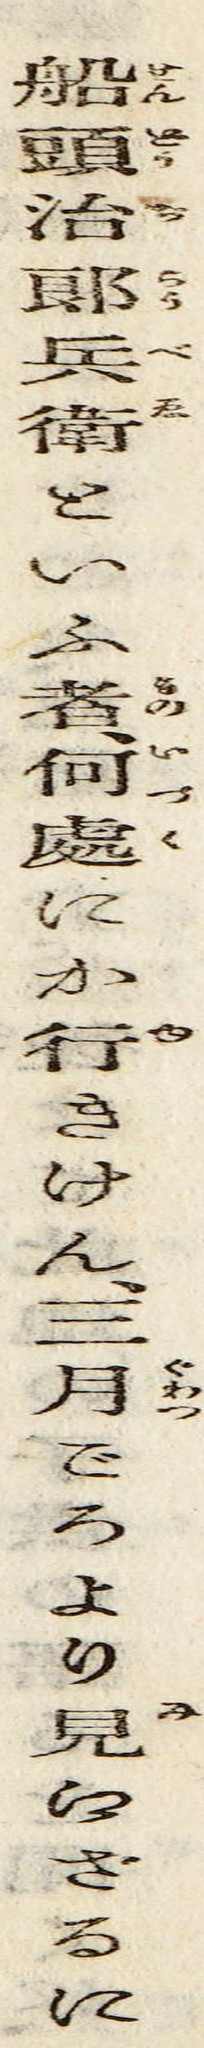船頭治郎兵衛といふ者、何処にか行きけん、三月ごろより見えざるに
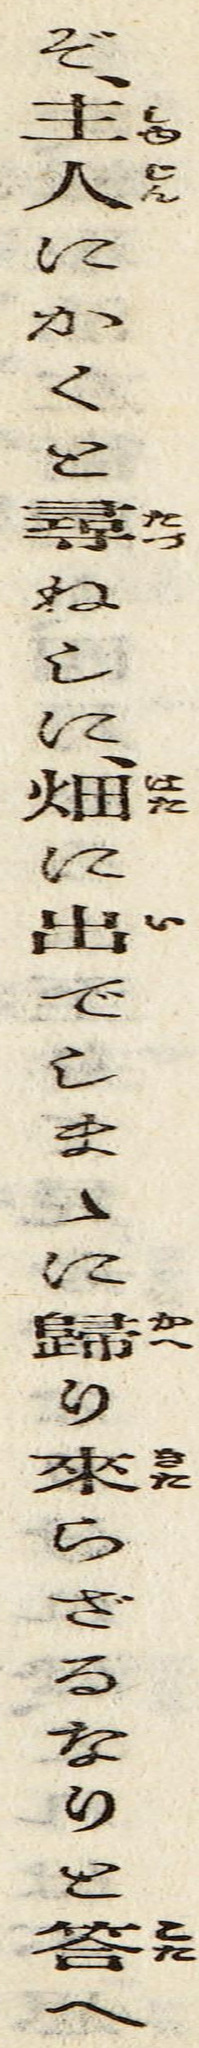ぞ、主人にかくと尋ねしに、畑に出でしまゝに帰り来らざるなりと答へ

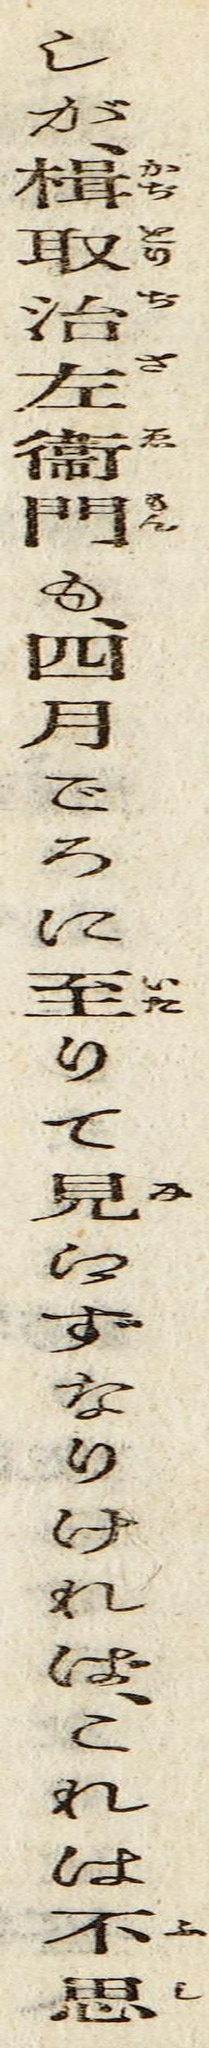しが、楫取治左衛門も、四月ごろに至りて見えずなりければ、これは不思
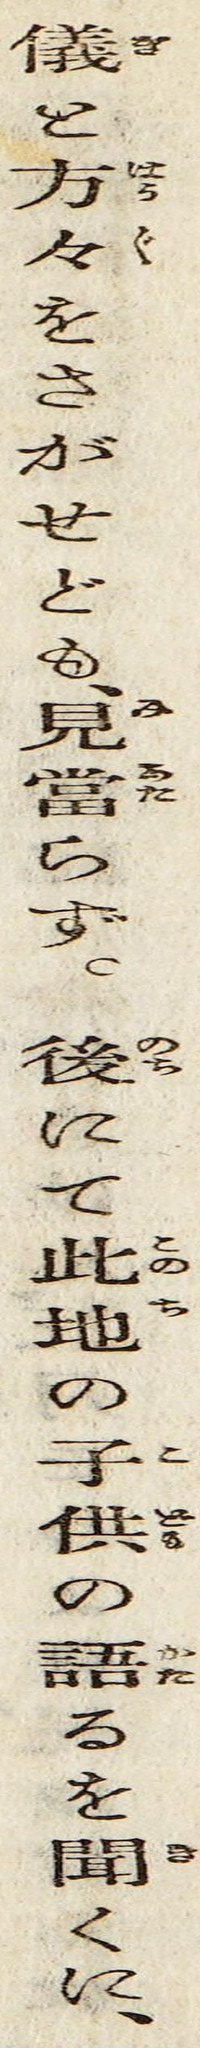儀と方々をさがせども、見当らず。後にて此地の子供の語るを聞くに、
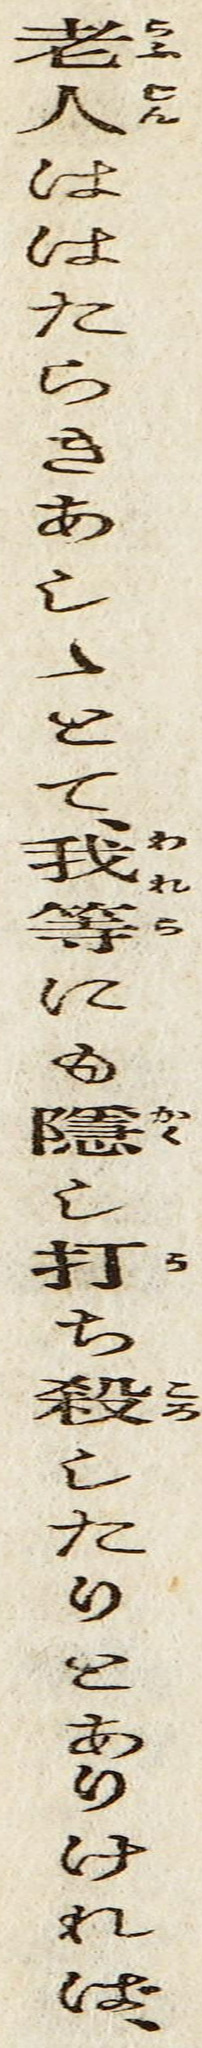老人ははたらきあしゝとて、我等にも隠し打ち殺したりとありければ、
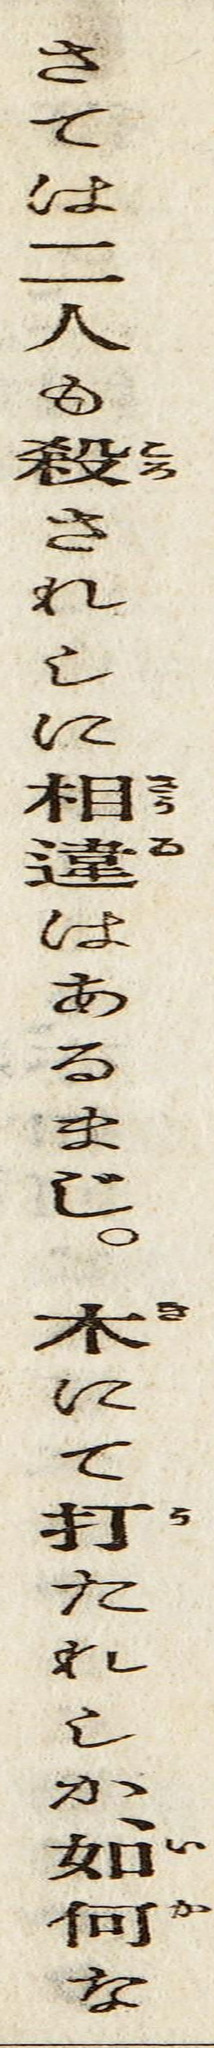さては二人も殺されしに相違はあるまじ。木にて打たれしか、如何な
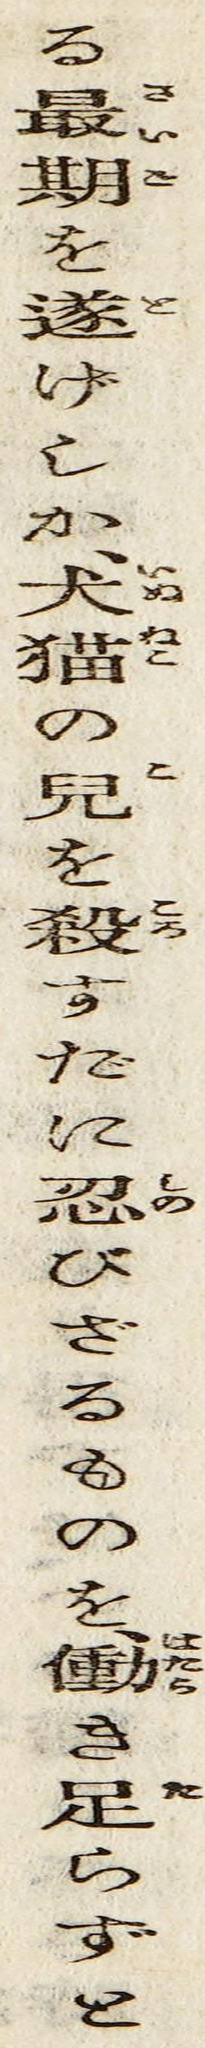る最期を遂げしか、犬猫の児を殺すだに忍びざるものを、働き足らずと
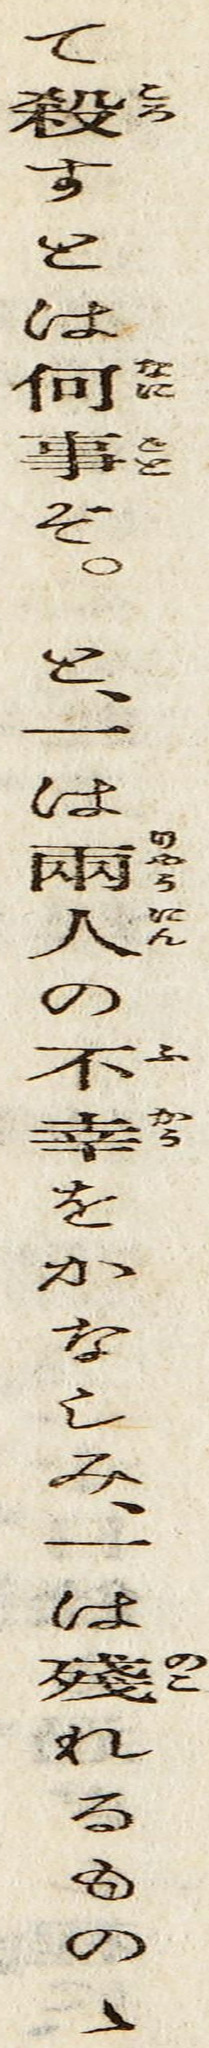て殺すとは何事ぞ。と、一は両人の不幸をかなしみ、一は残れるものゝ
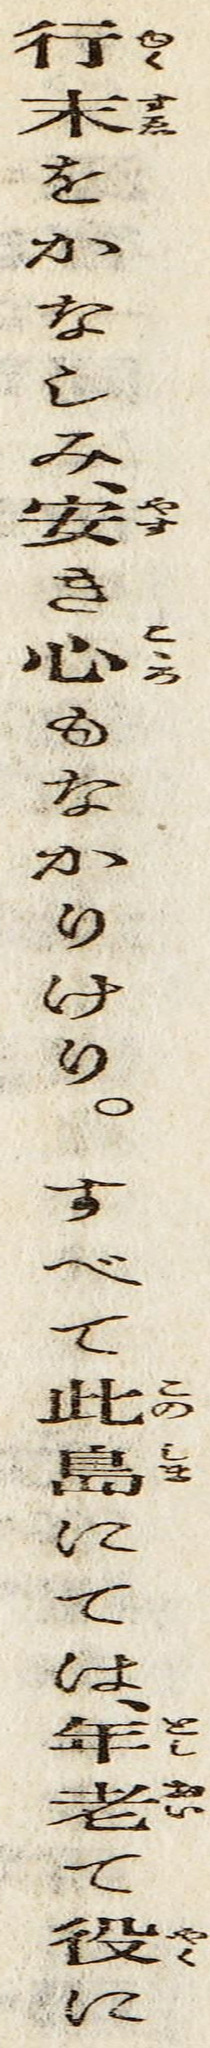行末をかなしみ、安き心もなかりけり。すべて此島にては、年老て役に
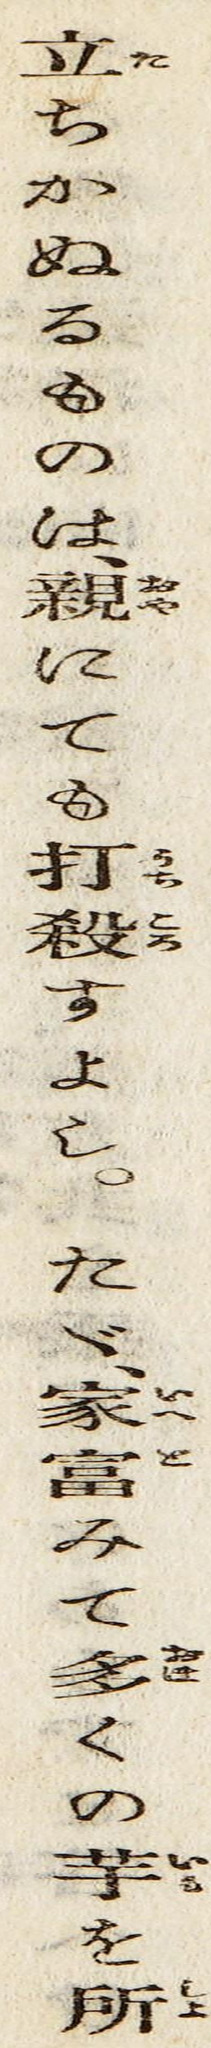立ちかぬるものは、親にても打殺すよし。たヾ、家富みて多くの芋を所
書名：日本漂流譚
